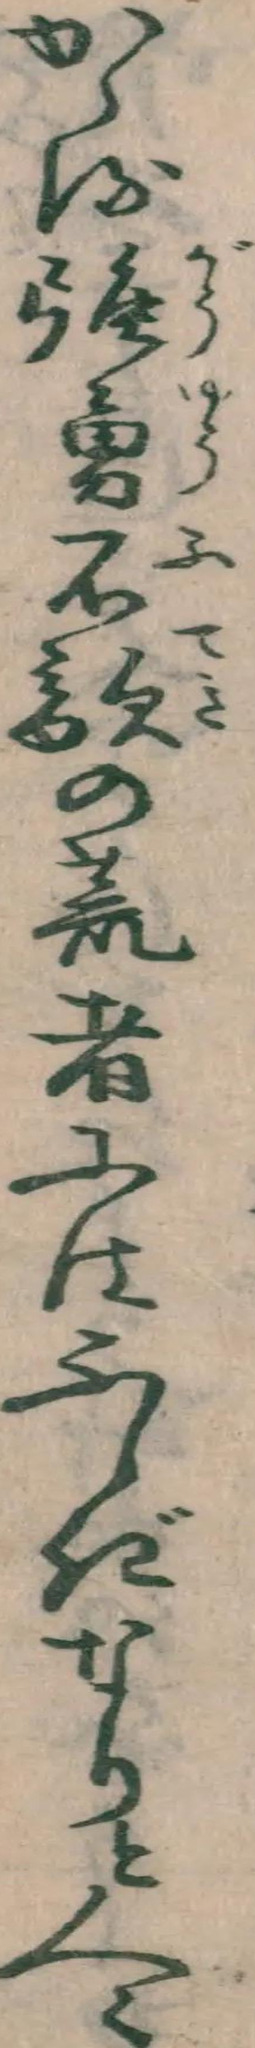かゝる強勇不敵の荒者にはふしぎなりと人々
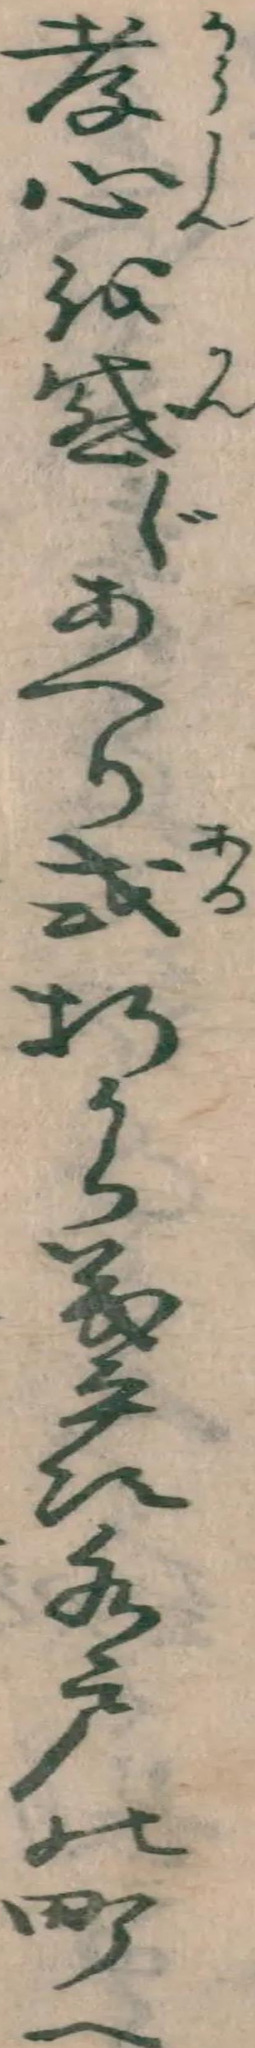孝心を感じあへり或折から義平次水戸の町へ
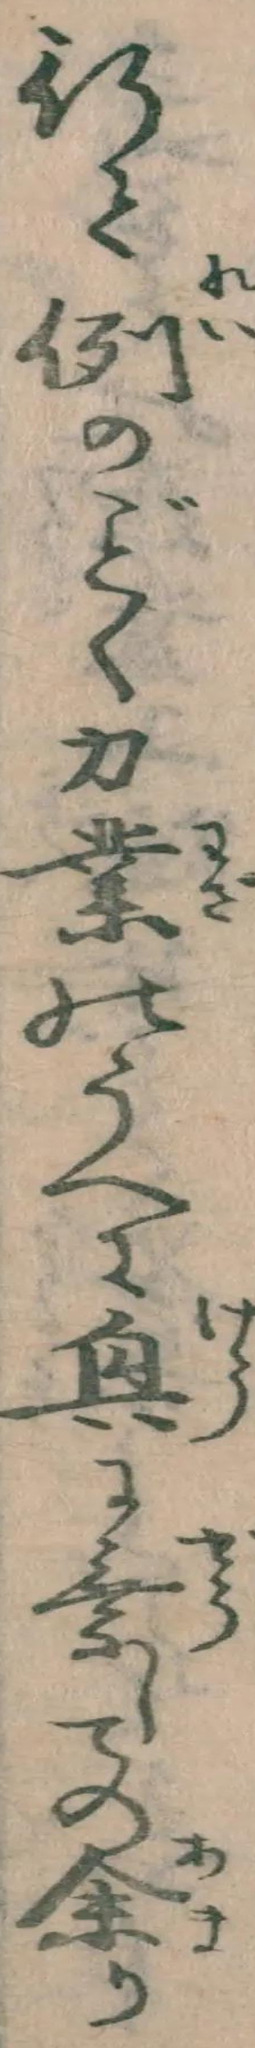行て例のごとく力業のうへに興に乗しての余り
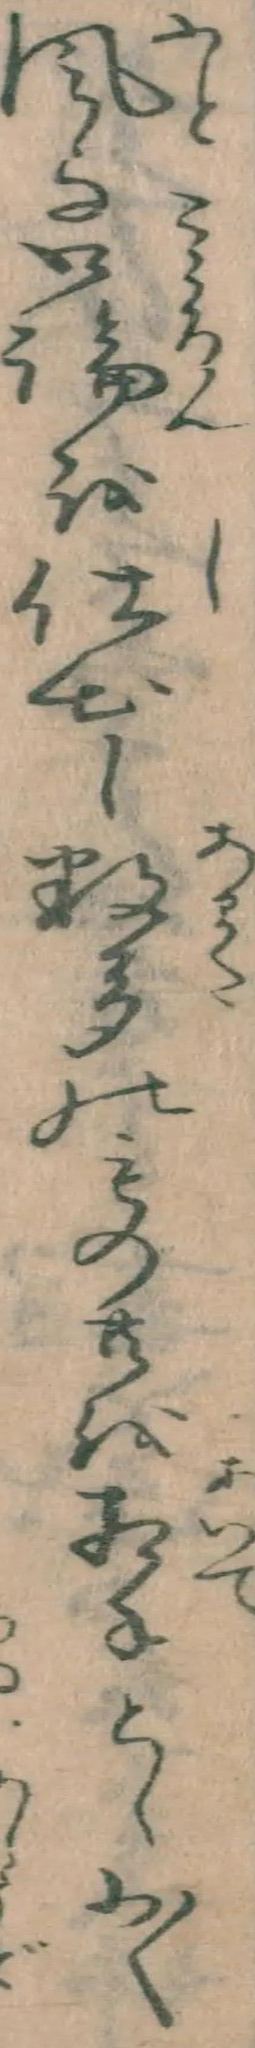風与口論を仕出し数多のもの共を相手とし少〳〵
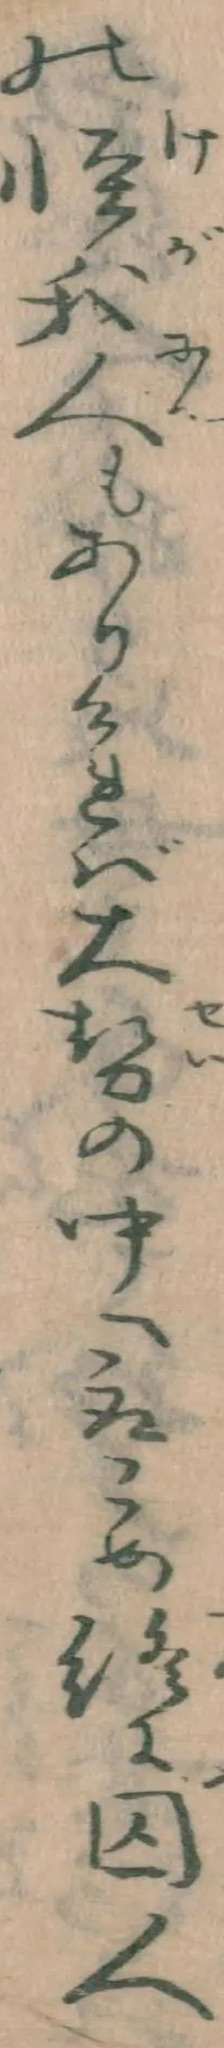の怪我人もありければ大勢の中へ取こめ終に囚人
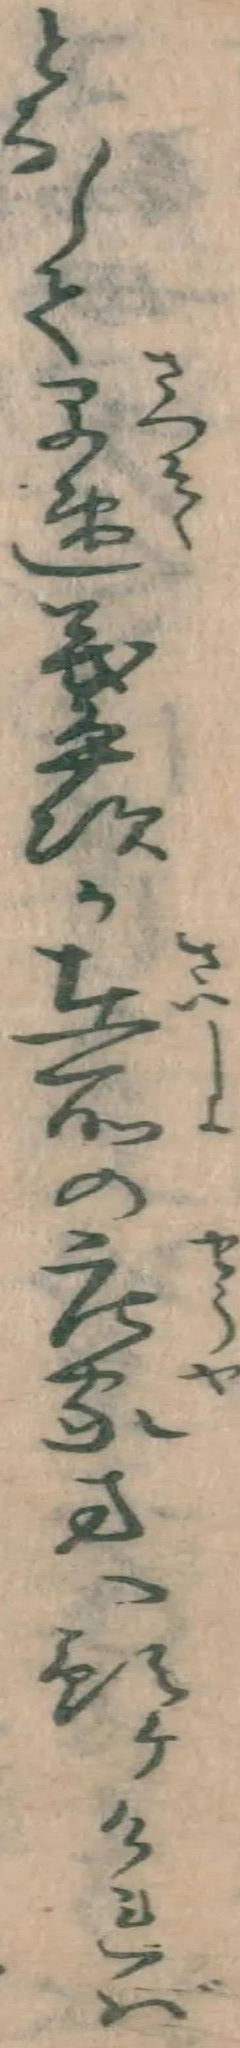となして早速義平次か在所の庄屋方へ預
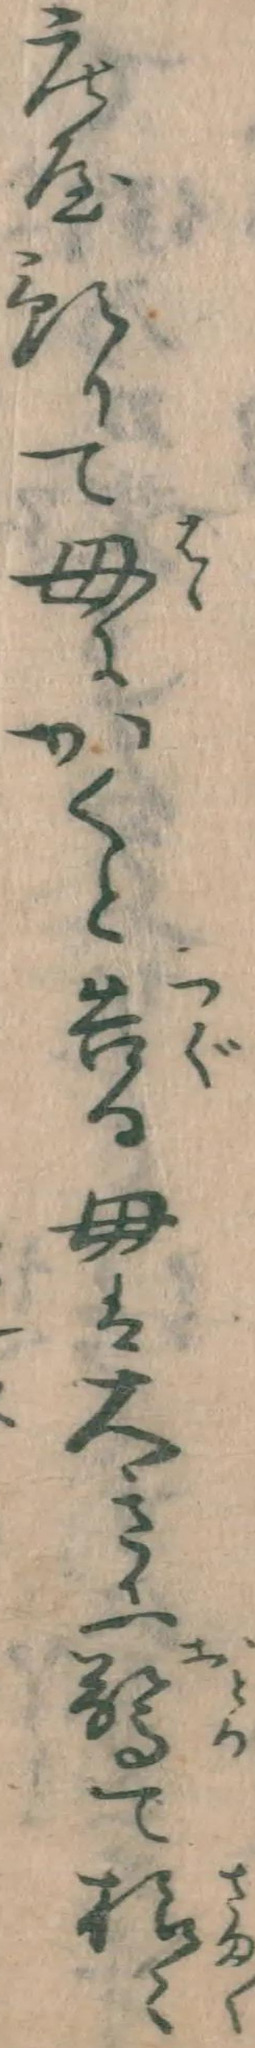庄屋預りて母にかくと告る母は大きに驚て様々
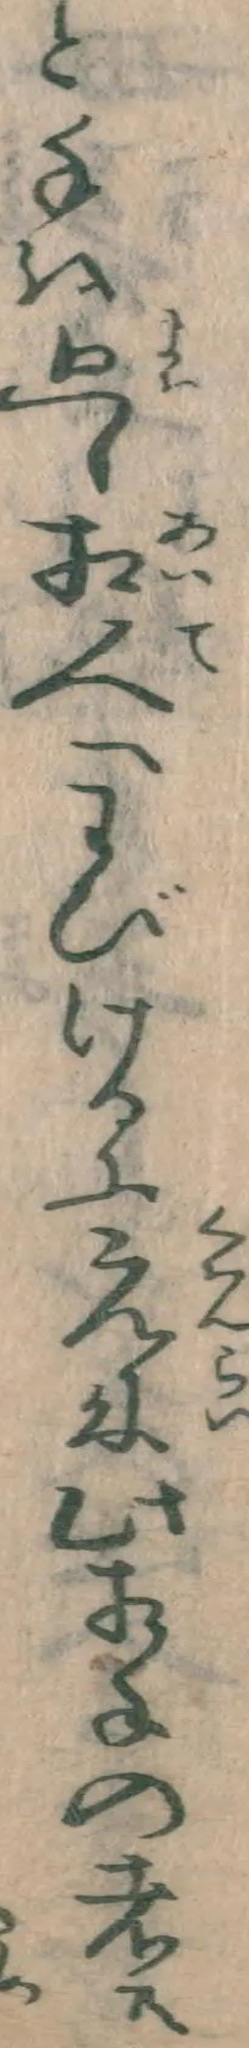と手を廻して相手へわびけるに元来此相手の者共
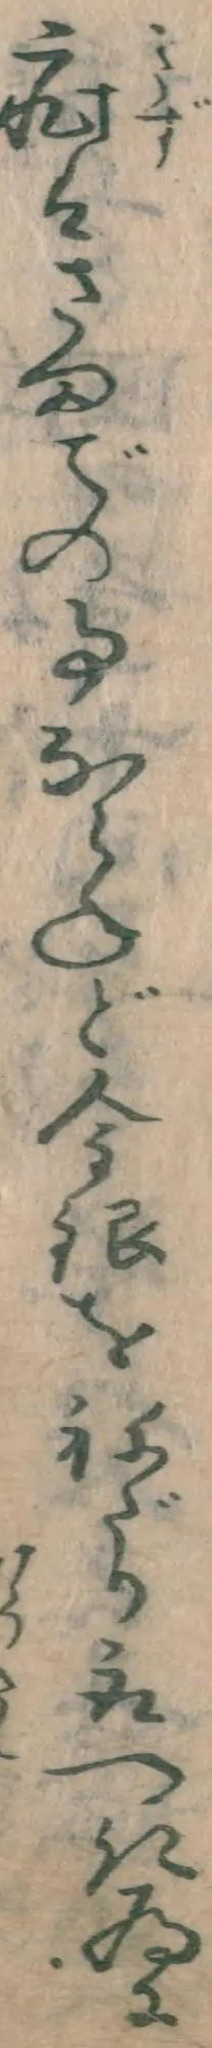疵はさまでの事ならねど金銀をねだり取へき為に
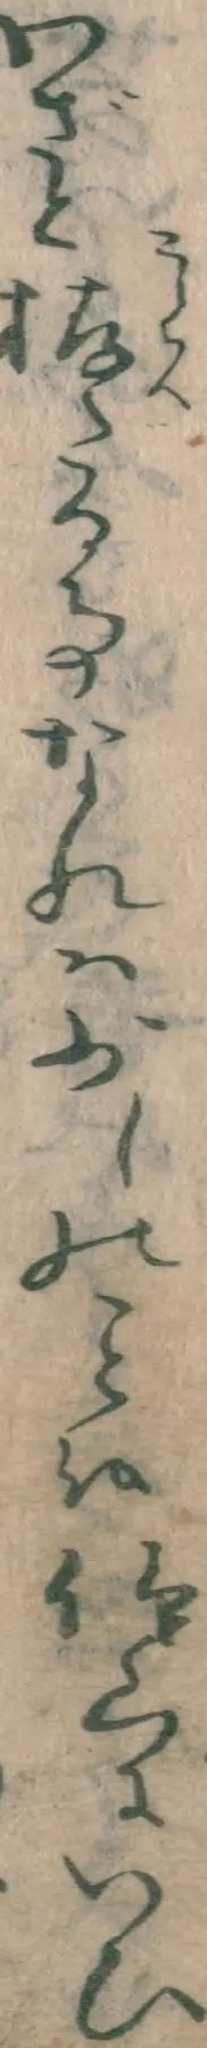わざと拵たる事なれは少しのことを仰山にいひ
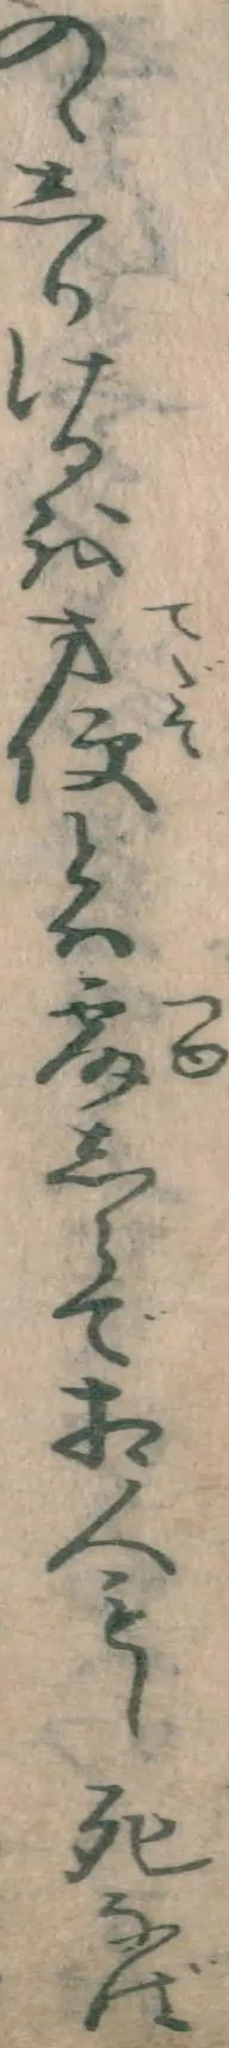のゝしりけるを手便とは露しらで相人もし死なば
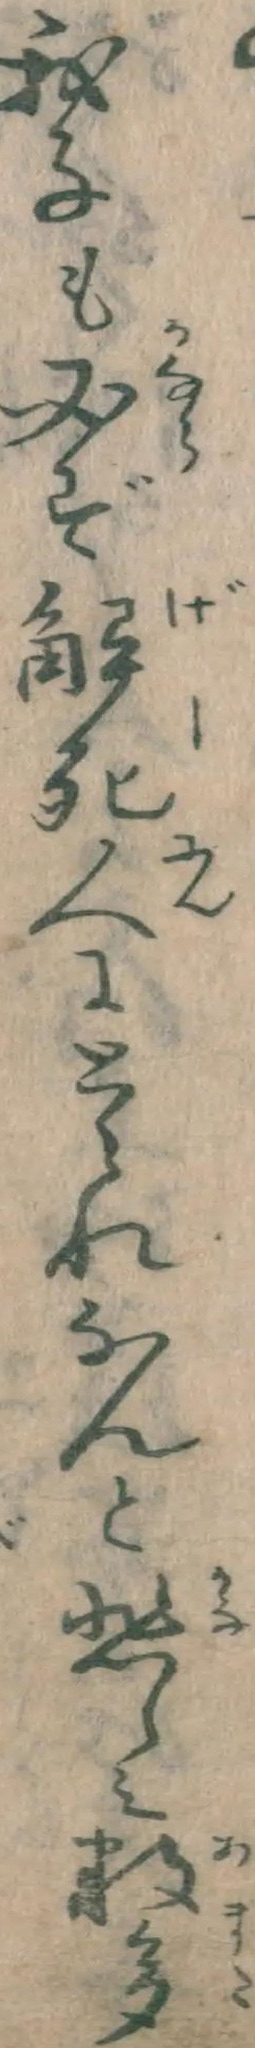我子も必ず解死人にとられなんと悲しみ数多
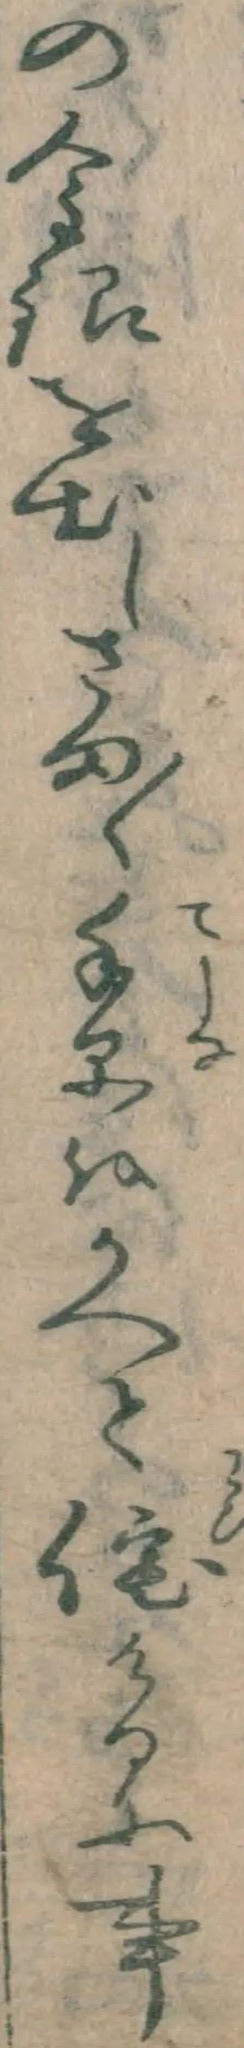の金銀を出しさま〳〵手品をかへて詫けるに事

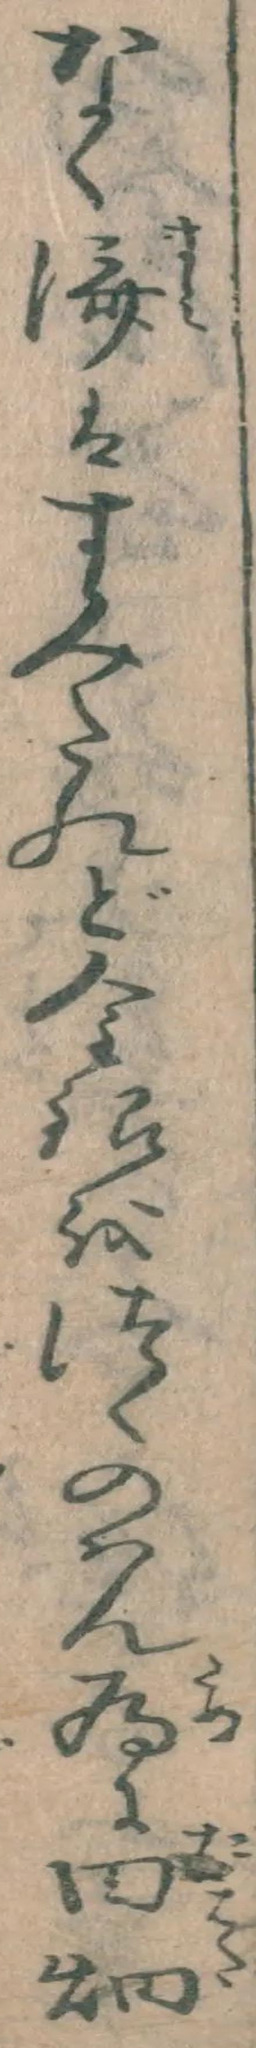なく済はすみたれど金銀をつくのはん為に田畑
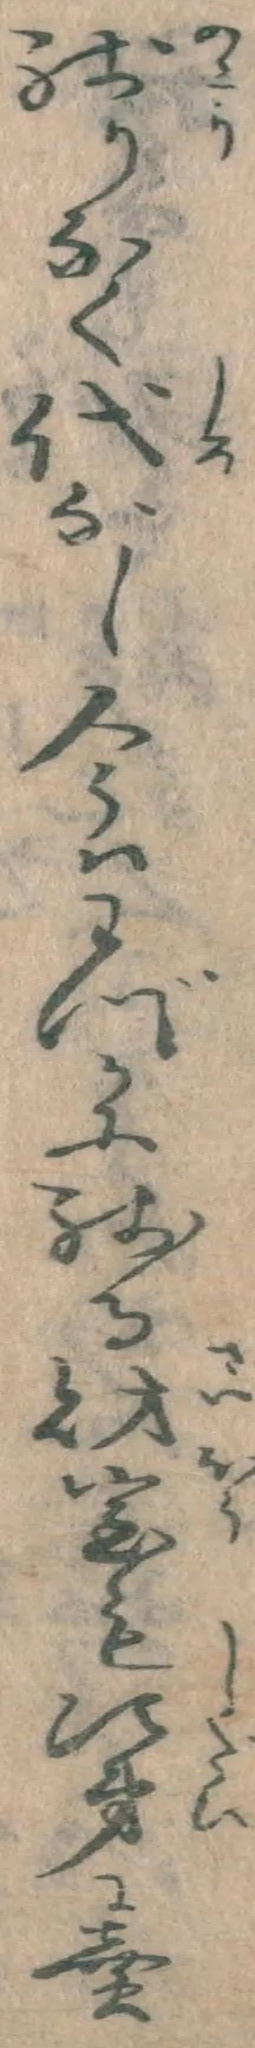残りなく代なし今はわづかに残る財宝も次第に売
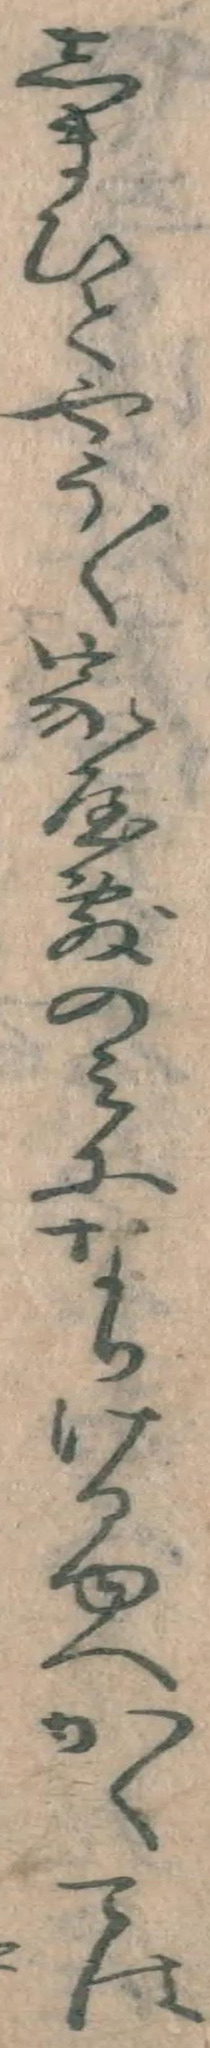しまひとやう〳〵家屋敷のみになりけるゆへかくては
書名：怪談御伽童 5巻. [1]
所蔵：国立国会図書館 National Diet Library, JAPAN
